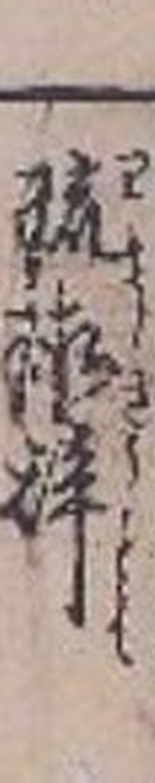琉球辞
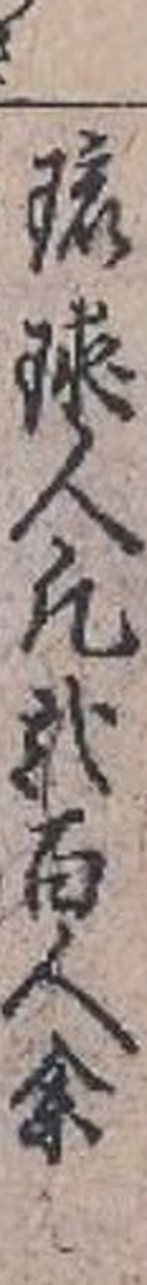琉球人凡弐百人余
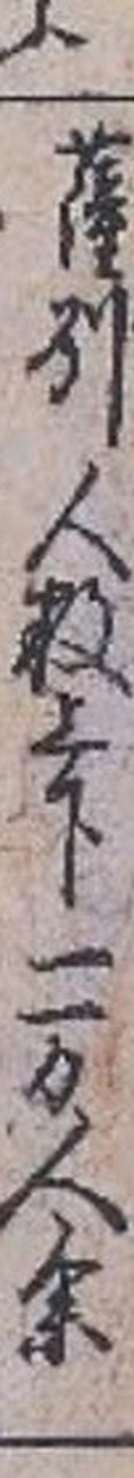薩州人数上下一万人余
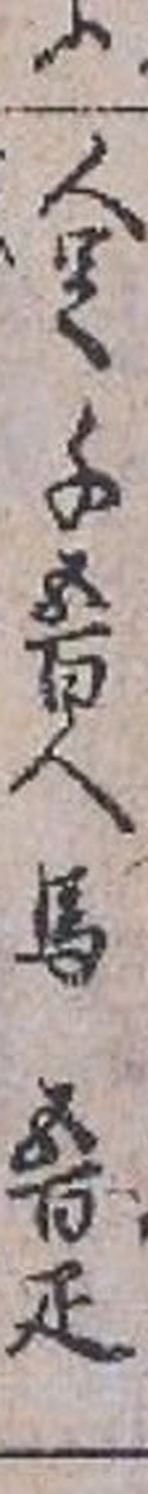人足千五百人馬五百疋
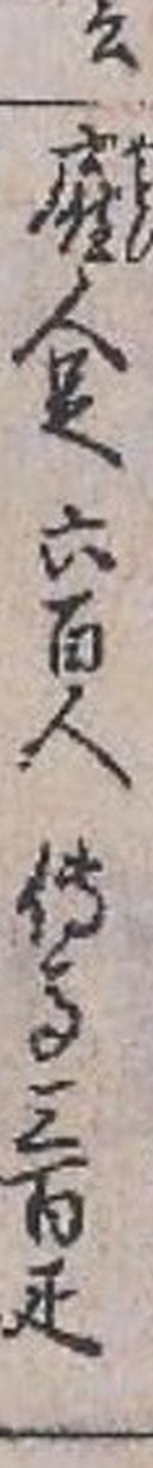雇人足六百人傳馬三百疋
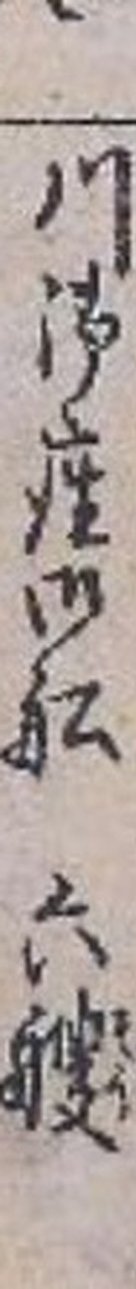川御座御船六艘
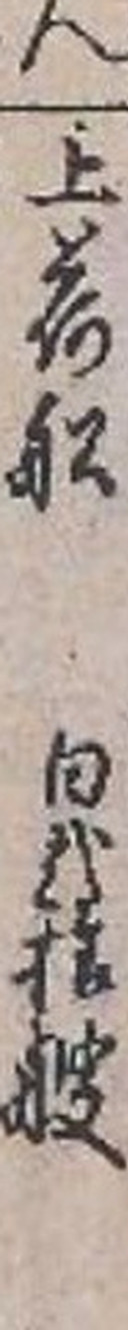上荷船百弐拾艘
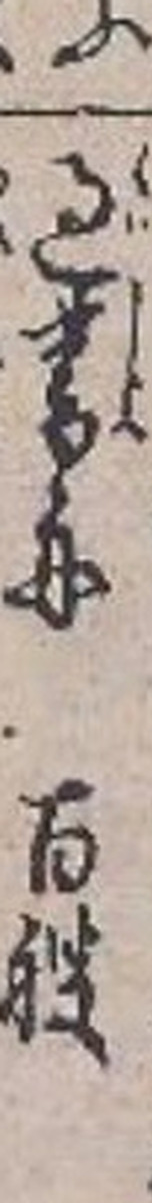過書舟百艘
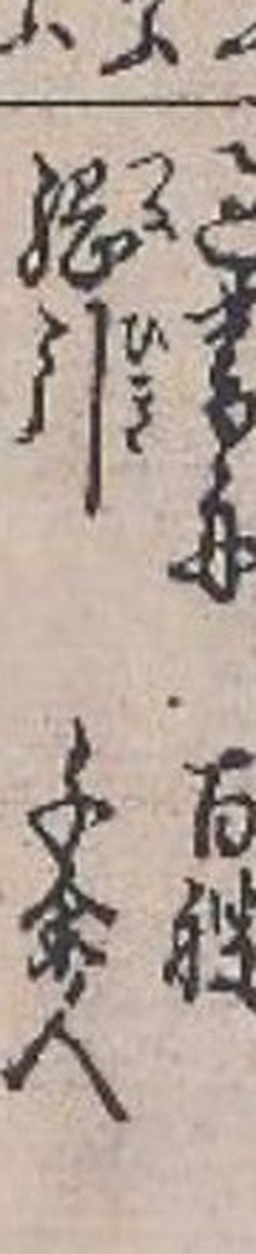綱引千余人
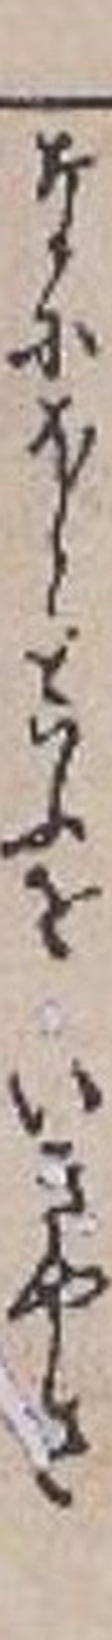なるほとといふをいきやき
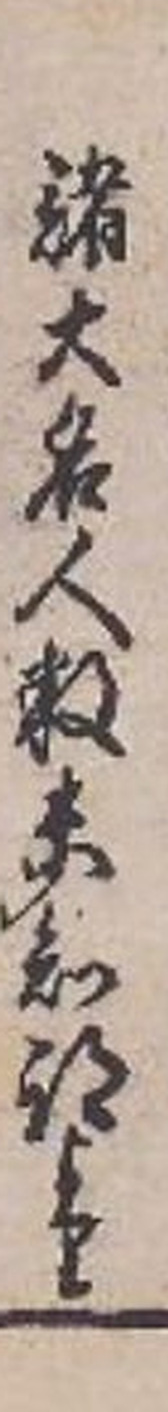諸大名人数未知跡より
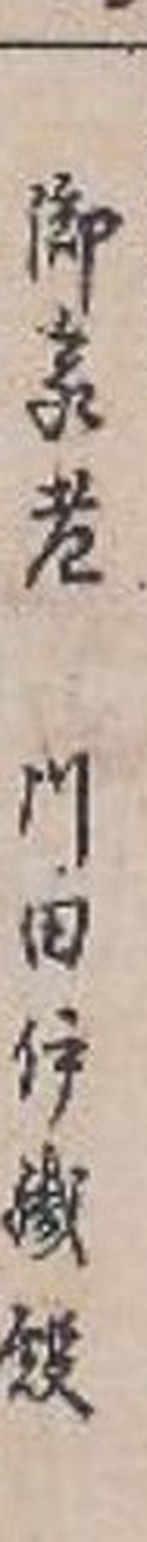御家老川田仲蔵殿
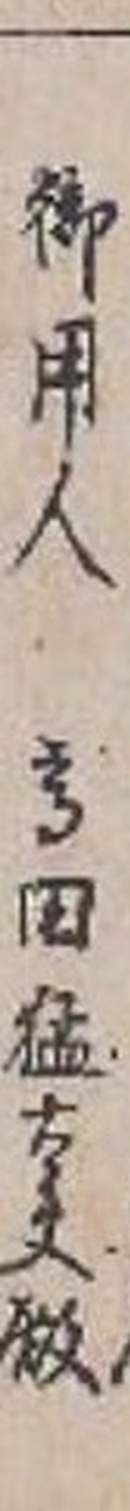御用人高田猛太夫殿
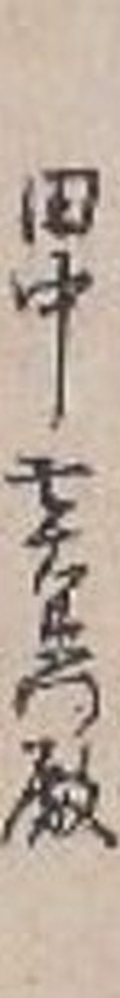物領田中七右衛門殿
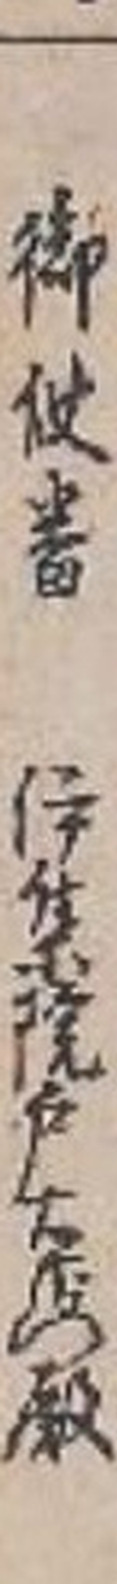御使番伊集院戸右衛門殿
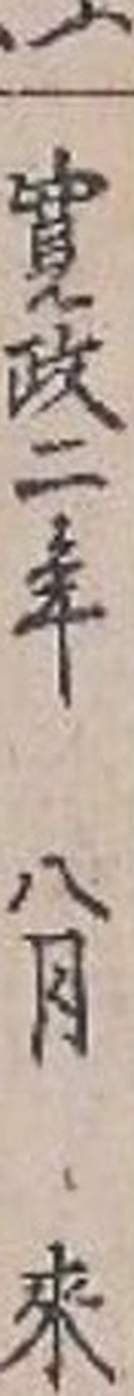寛政二年八月来朝
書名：琉球人大行列記 来朝新板絵入
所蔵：University of the Ryukyus Library
